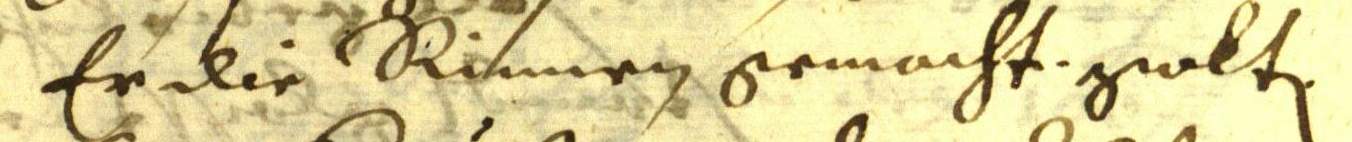Er die Rinnen gemacht. golt.
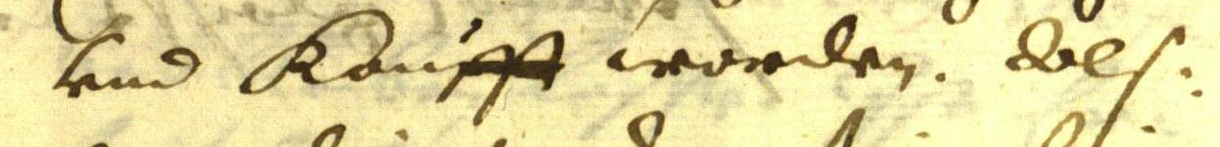vnd Kaūfft worden. Als¬
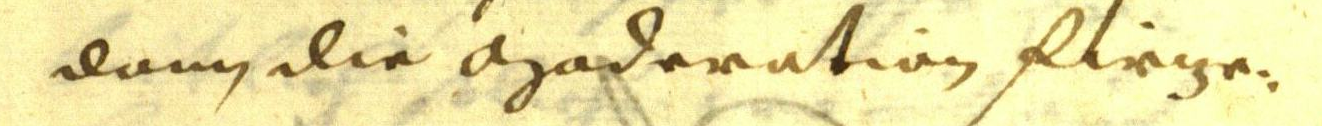dann die Moderation firze¬
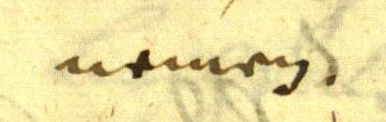nemen.
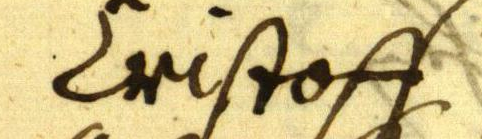Cristoff
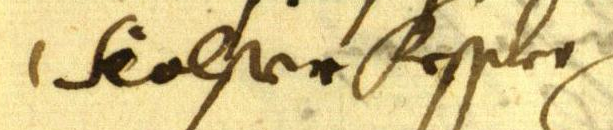Kalser Kessler
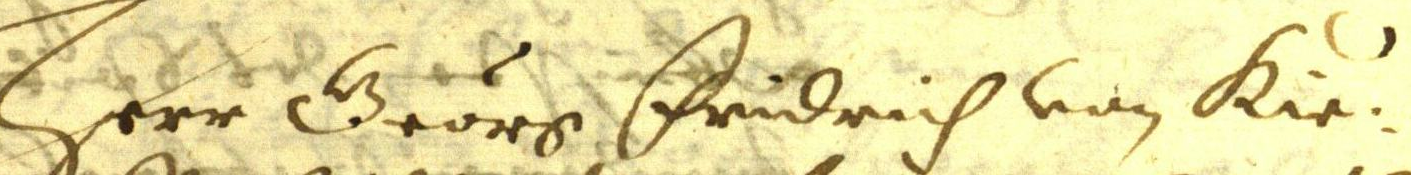Herr Geōrg Fridrich von Kie¬
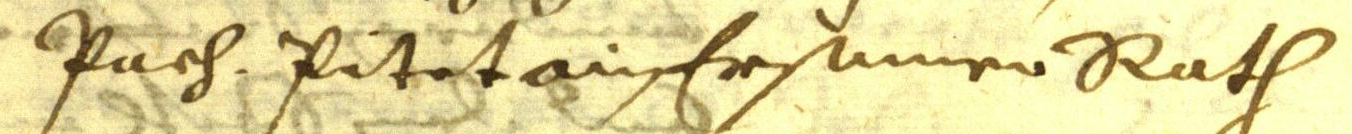Pach. Pitet ain Ersamer Rath
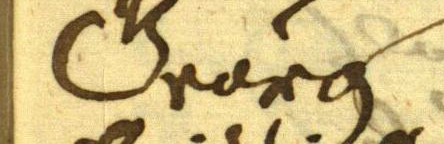Geōrg
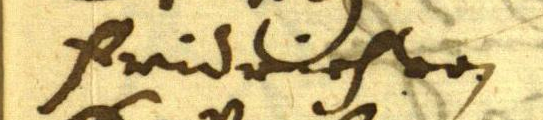fridrich von
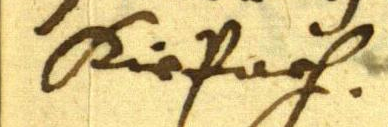Kiepach.
